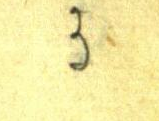3
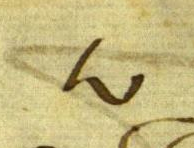t
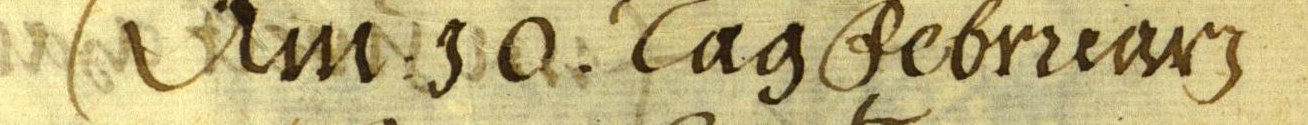Am: 10. Tag Febrūarj
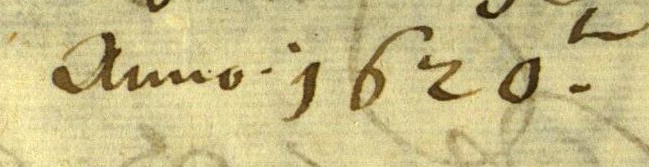Anno. 1620t.
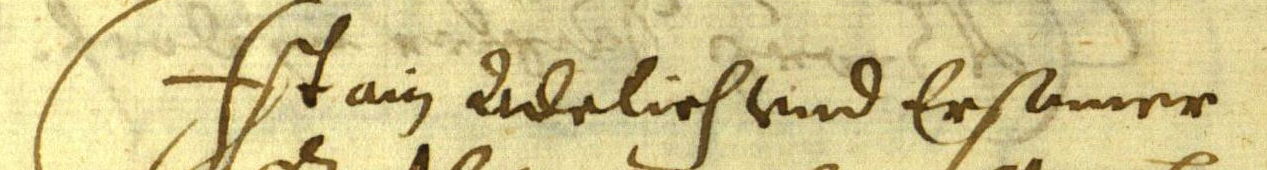Ist ain Adelich vnd Ersamer
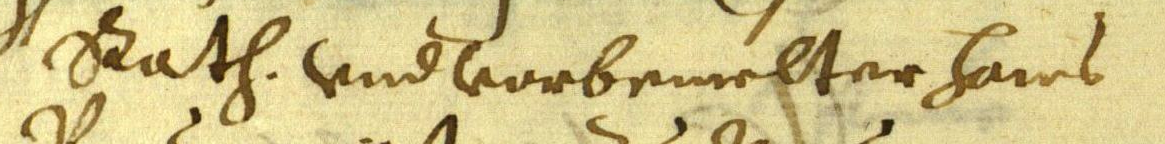Rath. vnd vorbemelter Hans
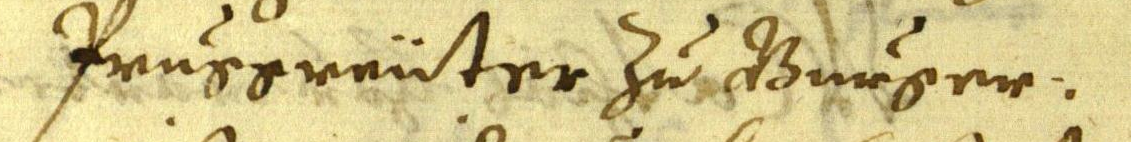Prūggreüter Zū Būrger¬
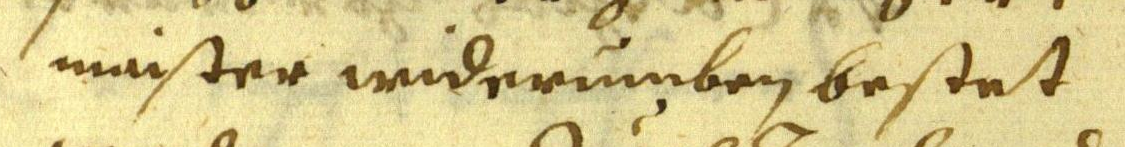maister widerūmben bestet
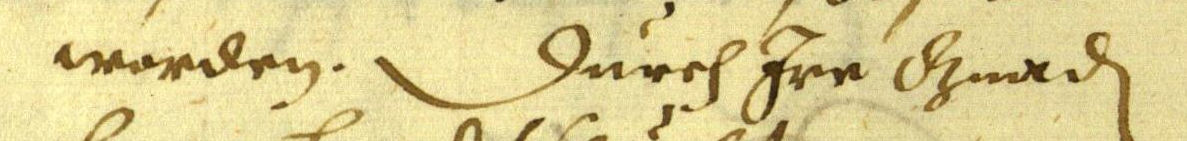worden. Dūrch ire Gnad
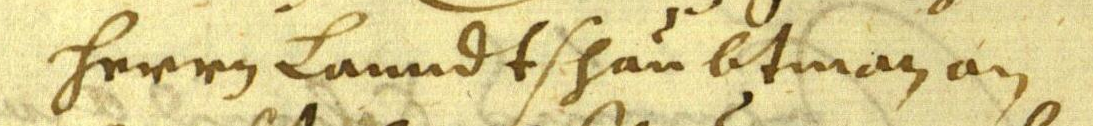Herrn Landthaūbtman an
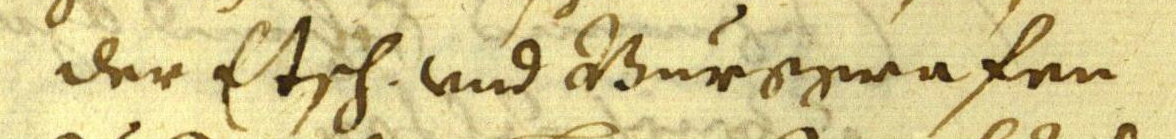der Etsch. vnd Būrggrafen
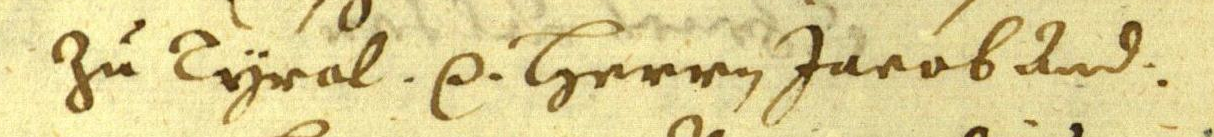Zū Tÿrol. etc. Herrn Jacob And¬
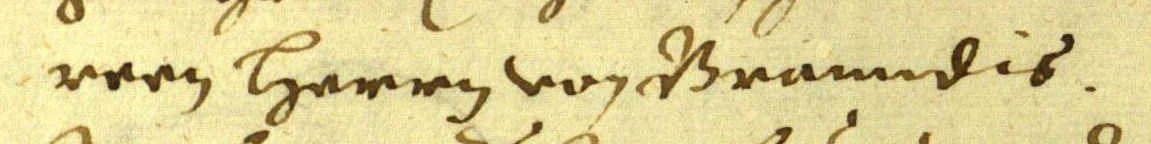reen Herrn von Branndis.
